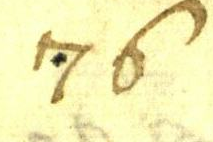76
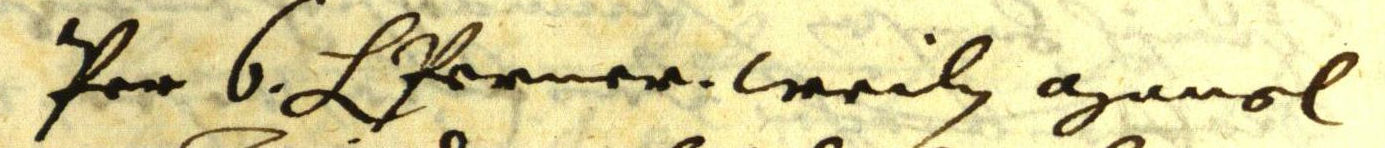Per 6. L Perner. weiln Mangl
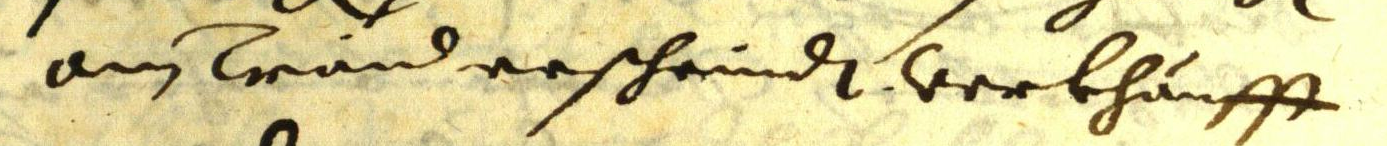am Traid erscheindt. verkhaūfft
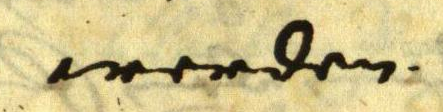werden.
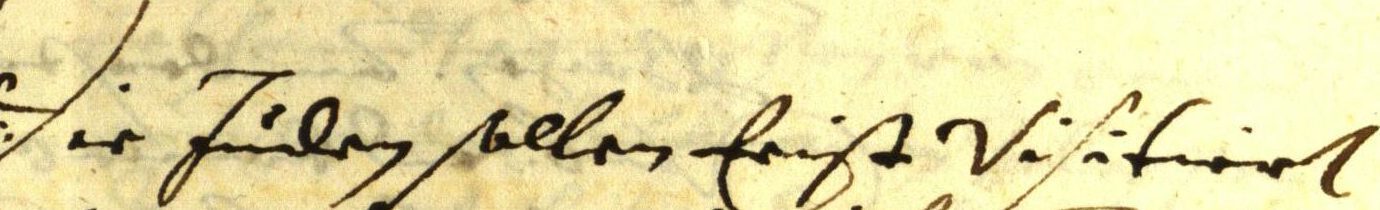Die Jūden sollen Eeist Visitiert
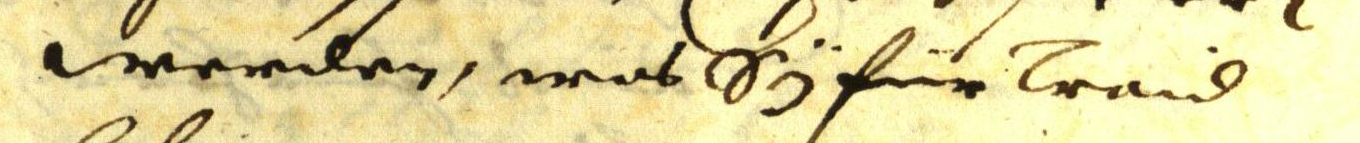werden, was Sÿ für Traid
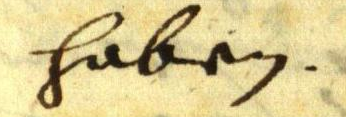haben.
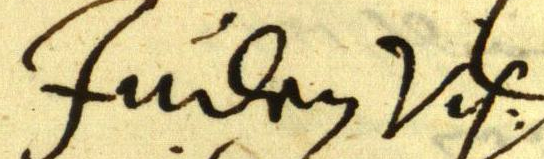Jūden Vis¬
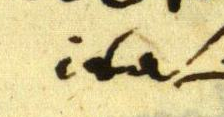ita.
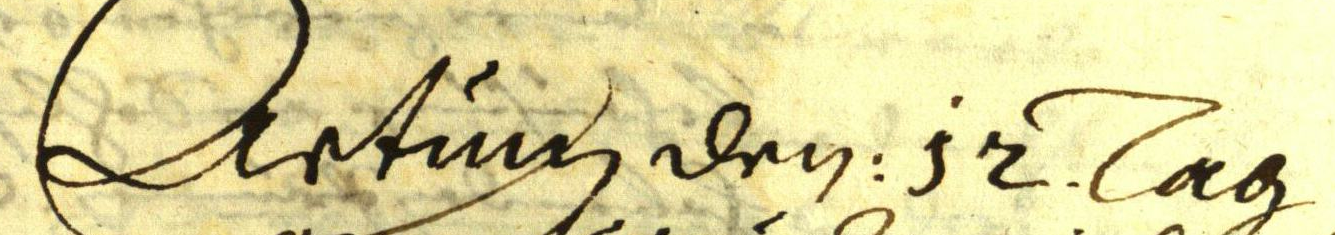Actūm den: 12. Tag
